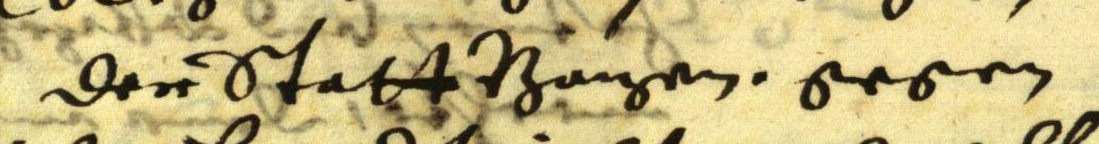der Statt Bozen. gegen
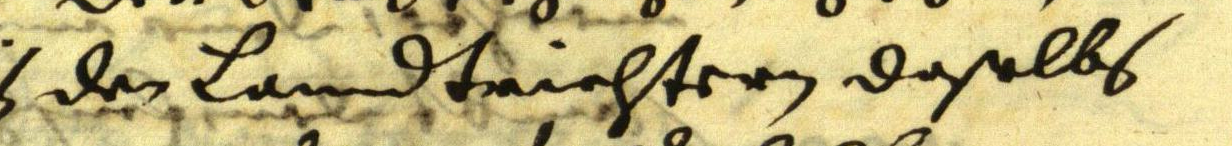den Landtrichtern daselbs
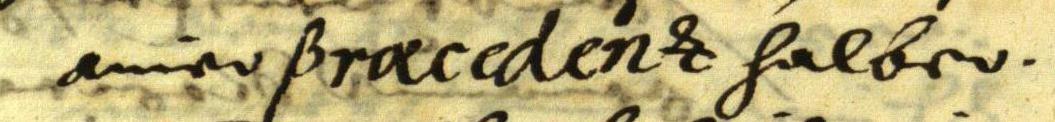ainer praecedenz halber.
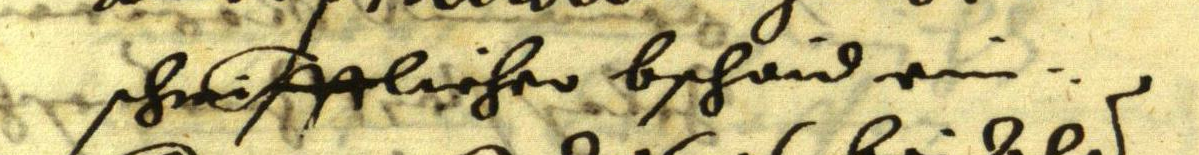schrifftlicher bschaid ein¬
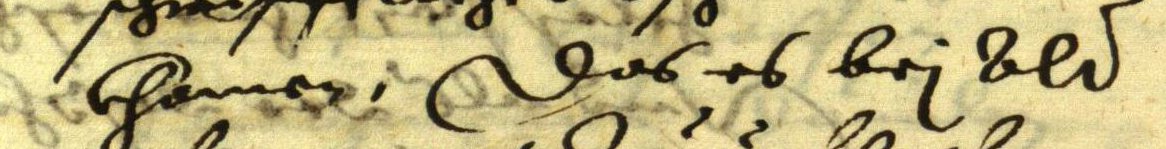khomen. Das es bej Ald
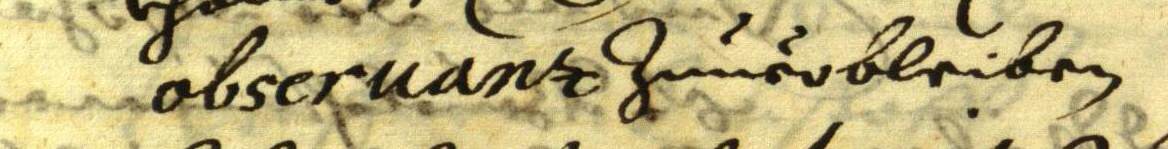observanz Zūūerbleiben
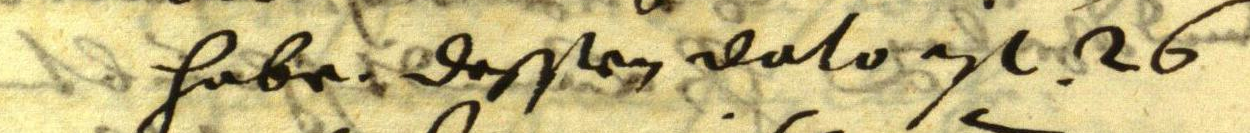habe. dessen dato ist .26
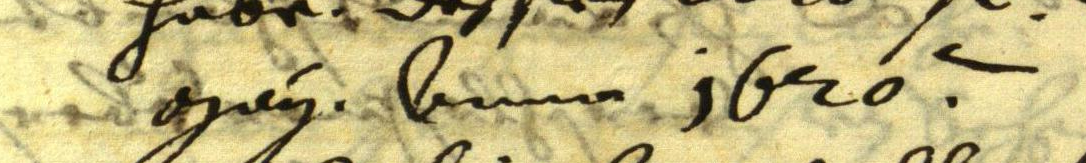Maȳ. Anno 1620.t
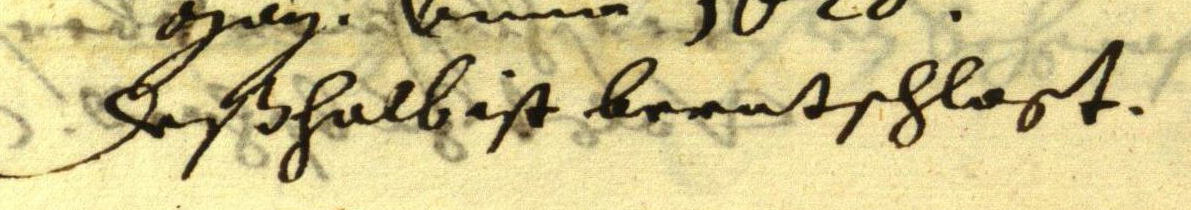Deßhalb ist beratschlagt.
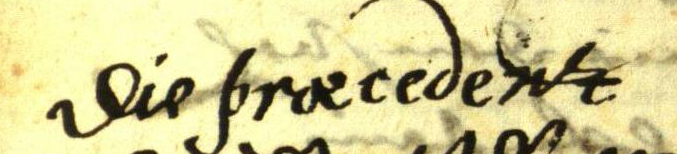Die praecedenz
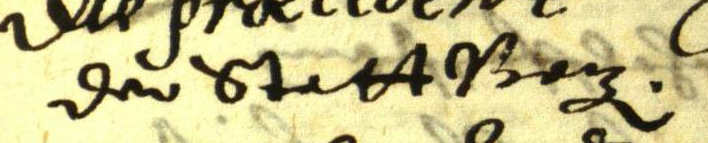der Statt Boz.
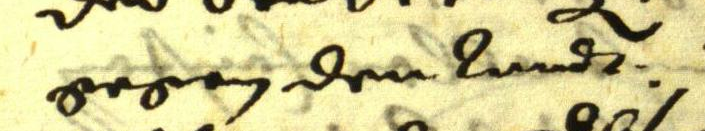gegen den Landt¬
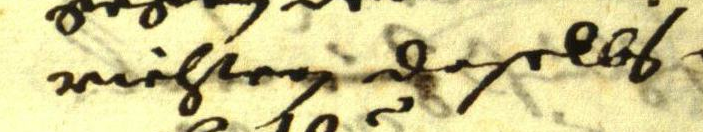richter daselbig
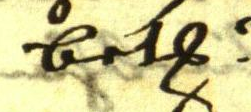bet:
